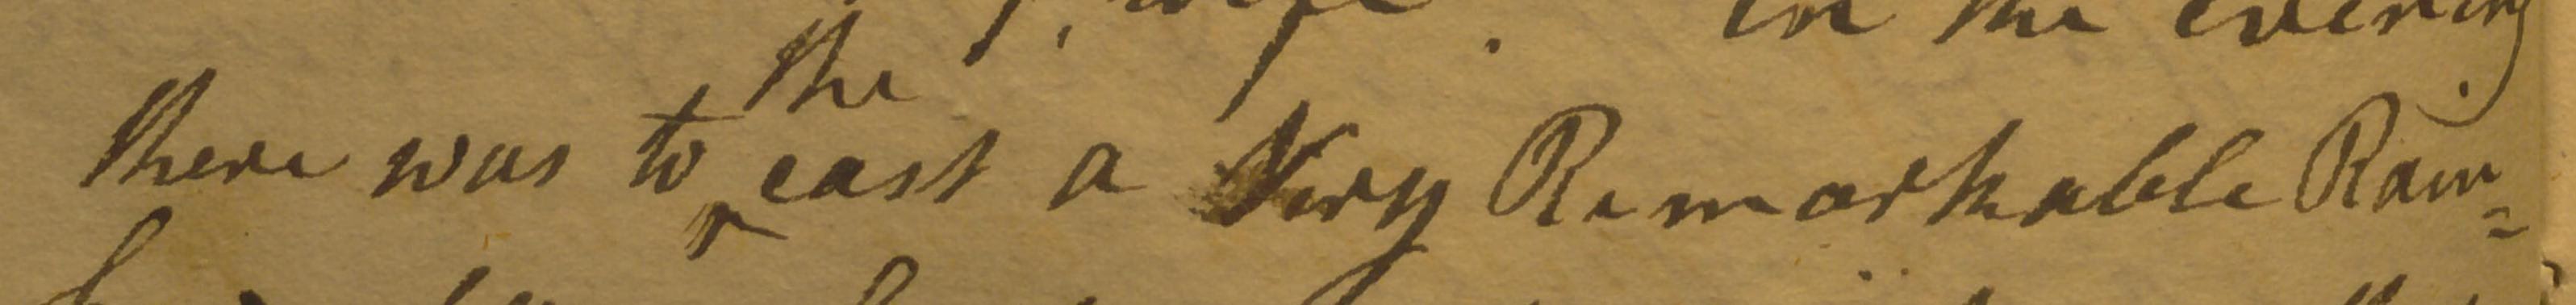there was to ^ east a Very Remarkable Rain
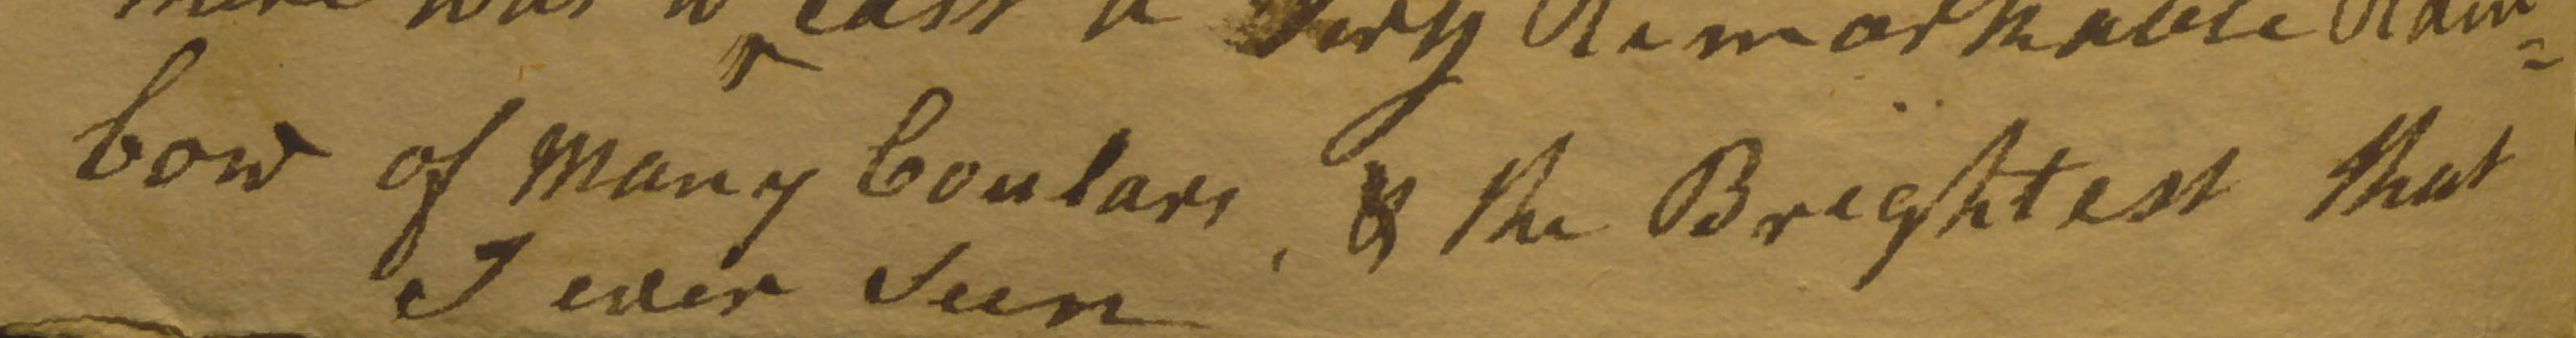bow of Many Coulars & the Brightest that
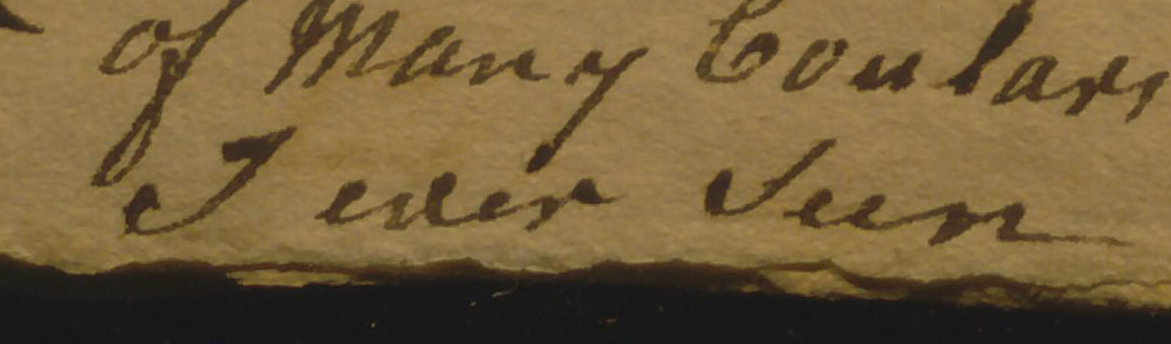I ever seen
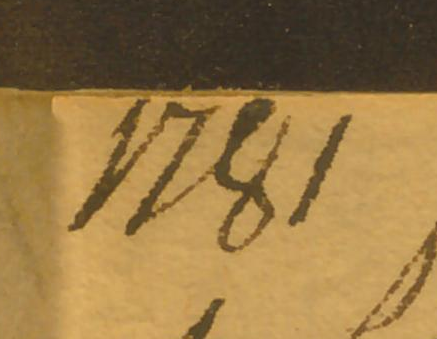1781
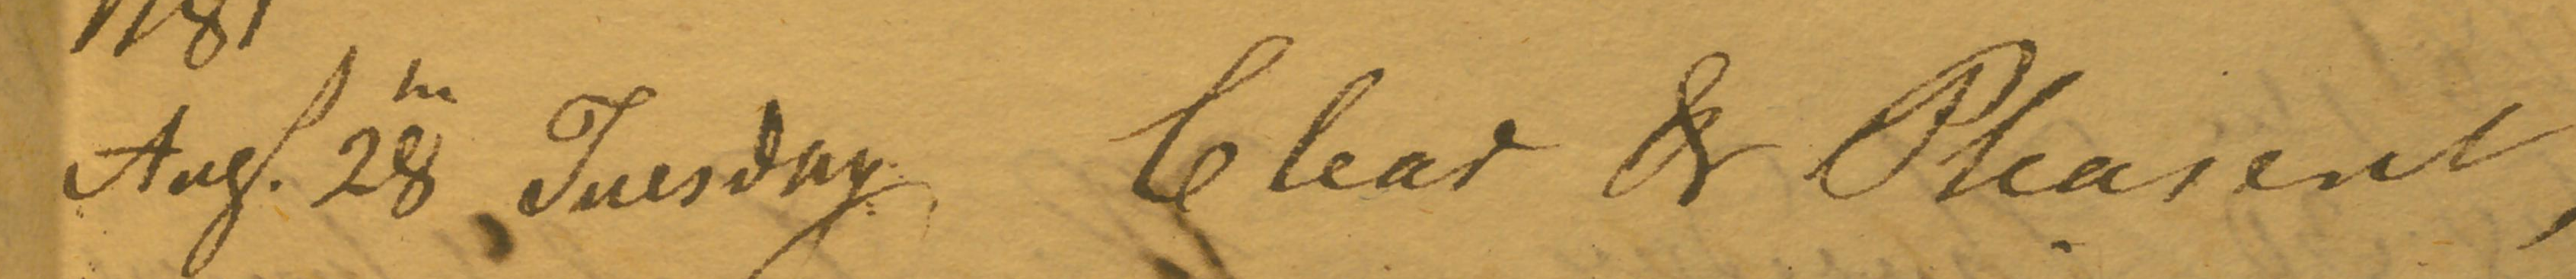Aug^t. 28^th Tuesday. Clear & Pleasent
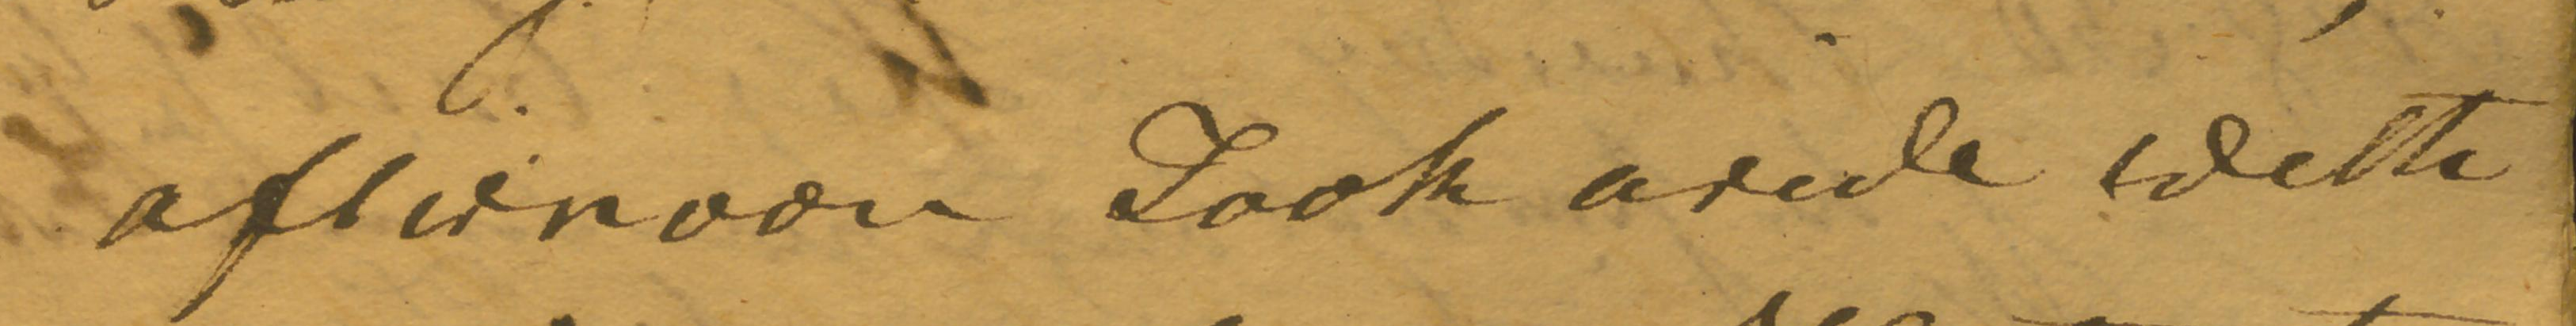afternoon Took a ride with
